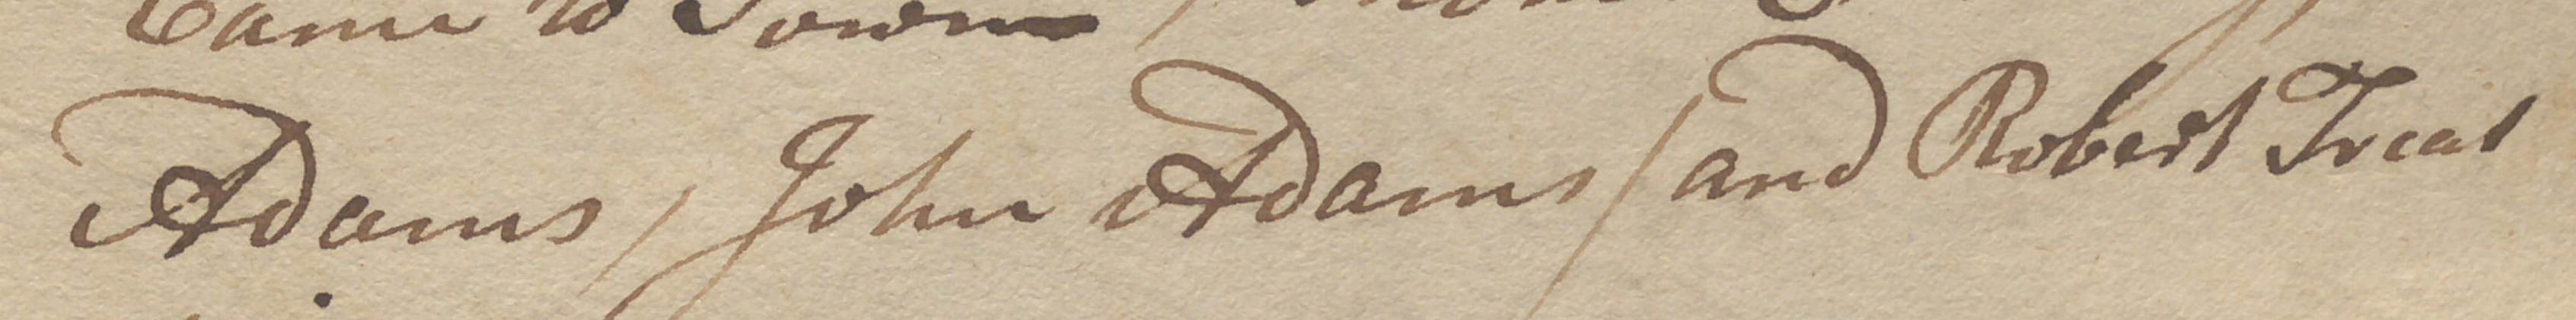Adams, John Adams and Robest Treat
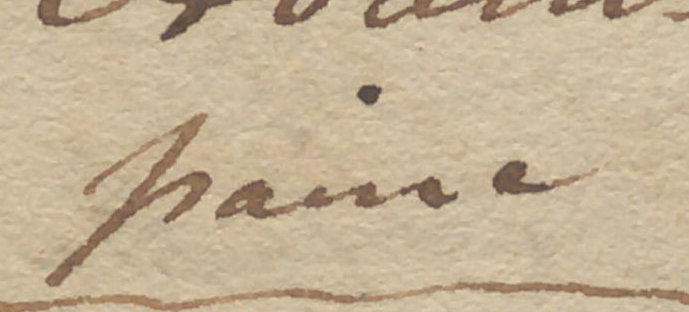paine
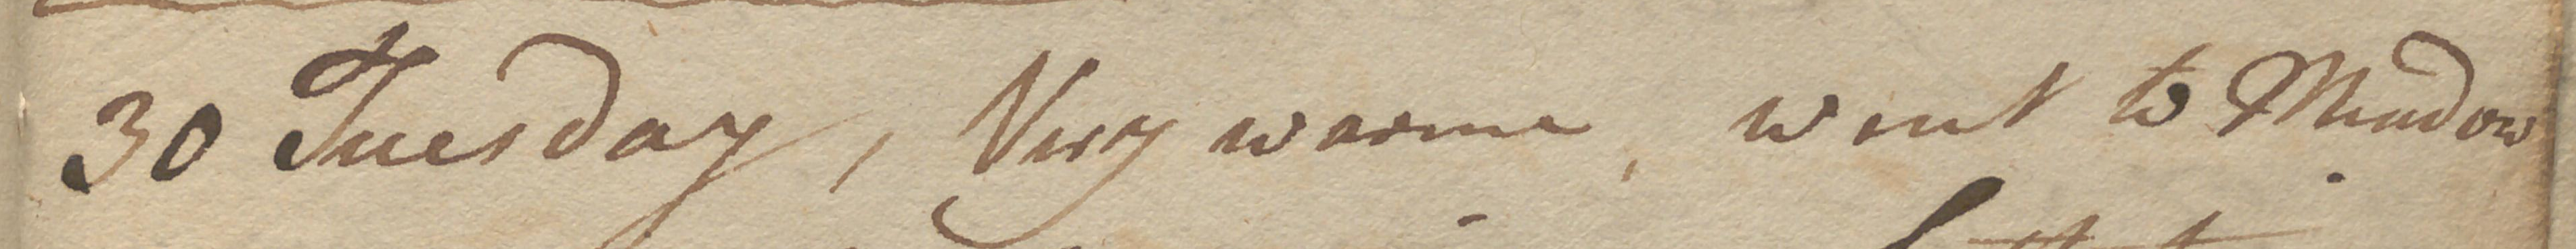30 Tuesday, Very warme went to Mendow
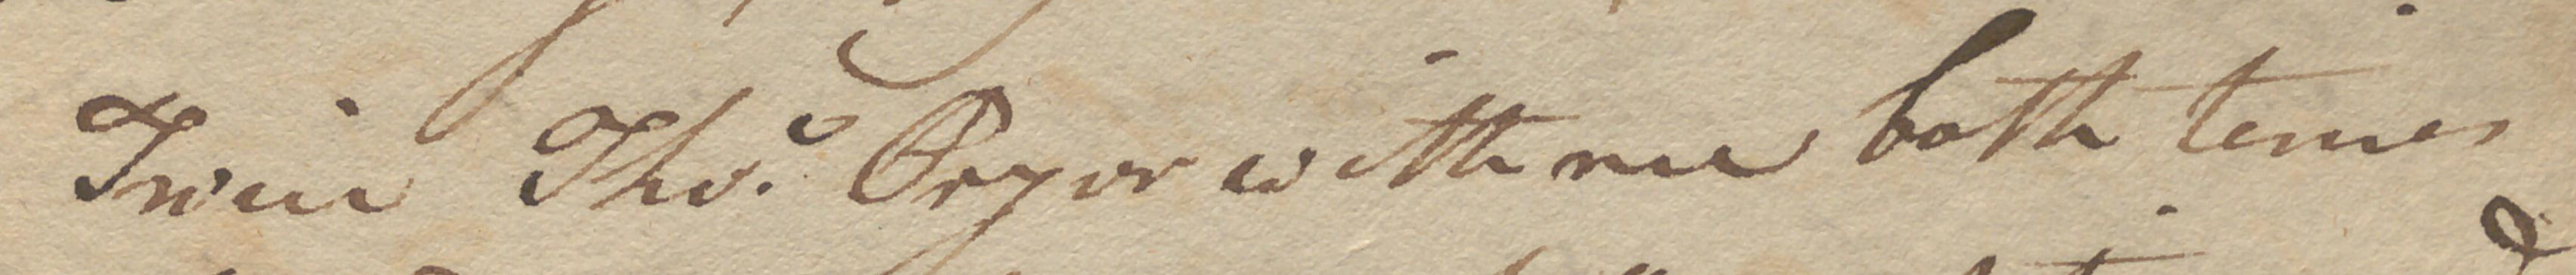Twin Tho^s. Pryor with me both times
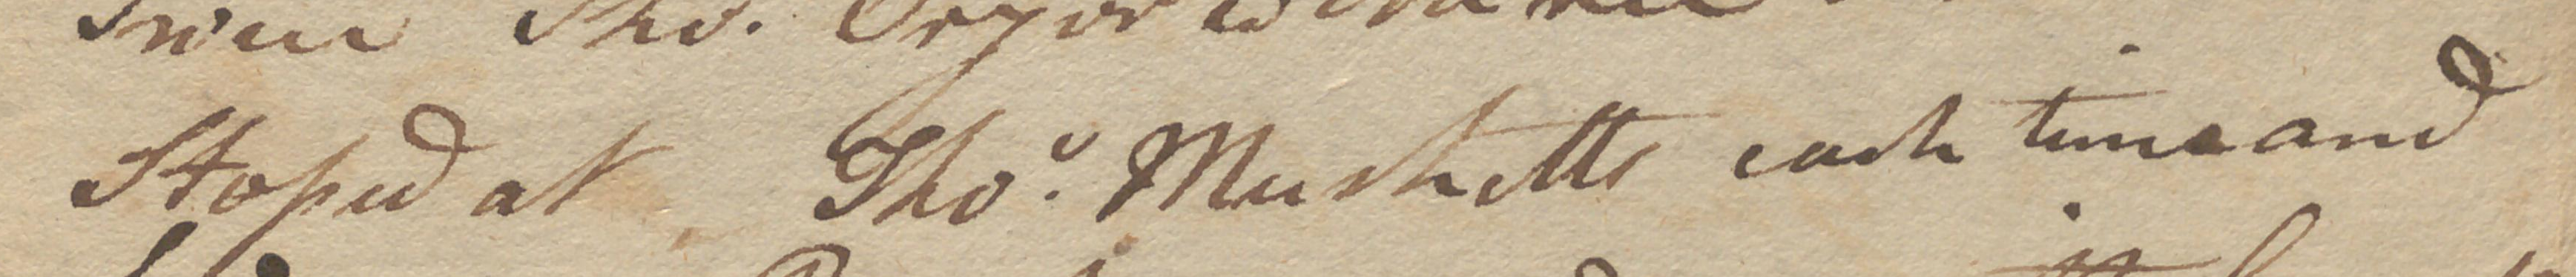Stoped at Tho^s. Mushetts each time and
